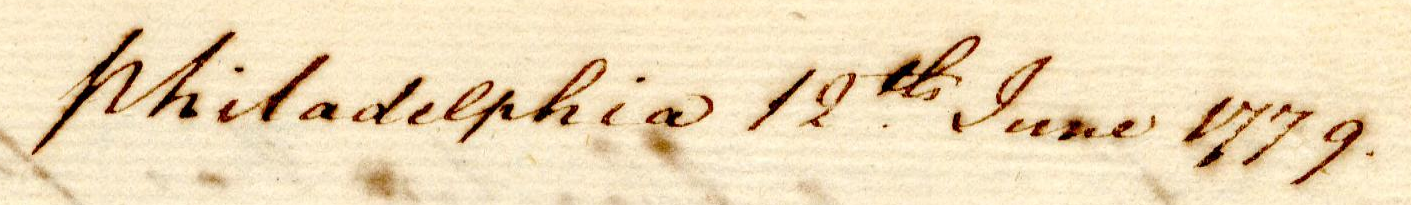Philadelphia 12^th June 1779.
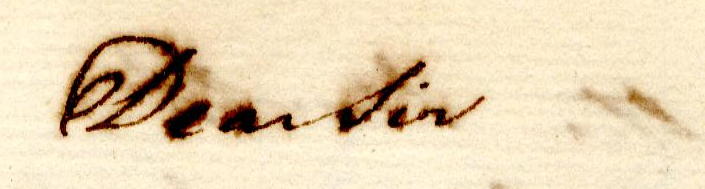Dear Sir
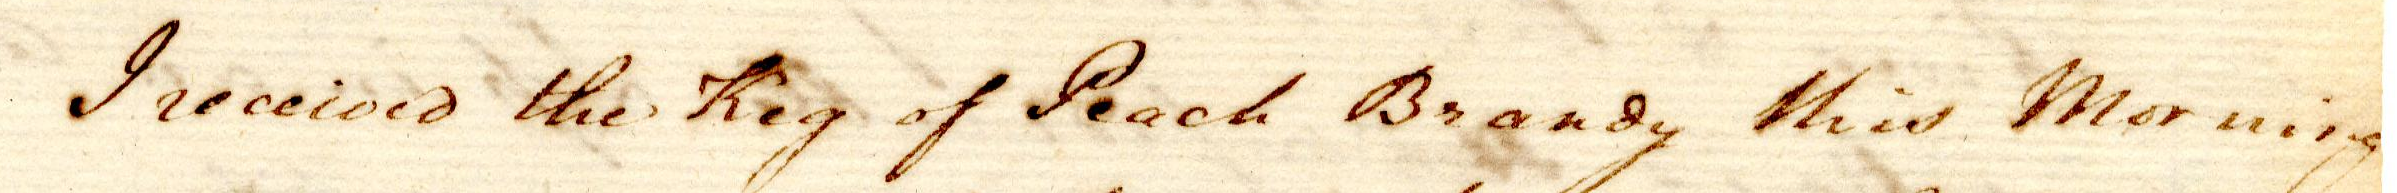I received the Keg of Peach Brandy this Morning
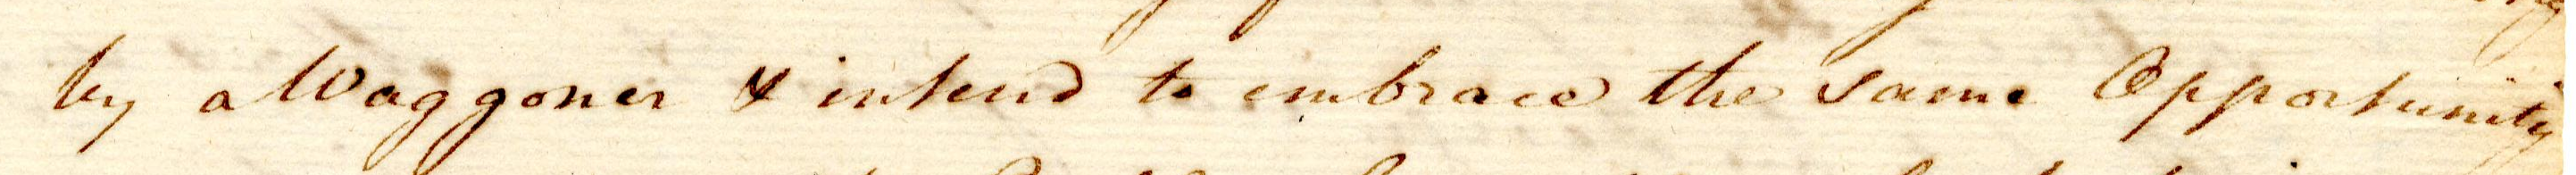by a Waggoner & intend to imbrace the same Opportunity
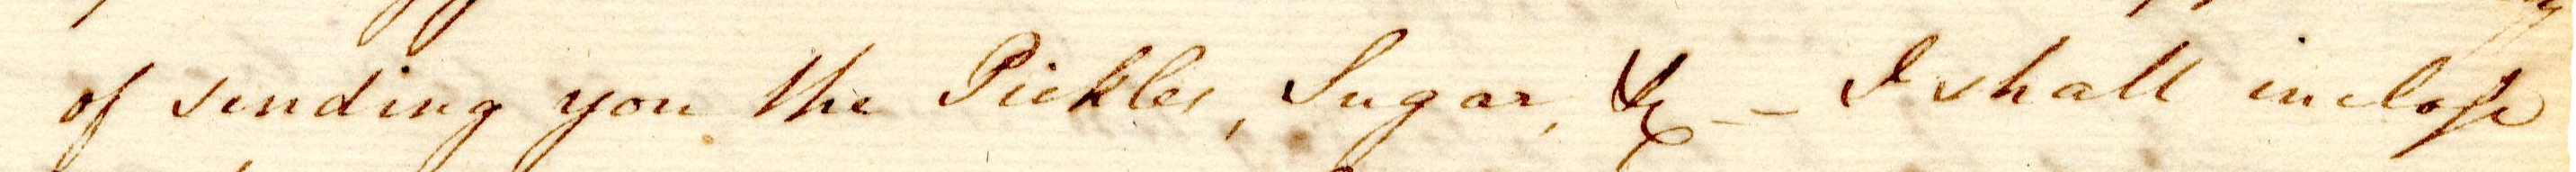of sending you the Pickles, Sugar, &c. I shall inclose
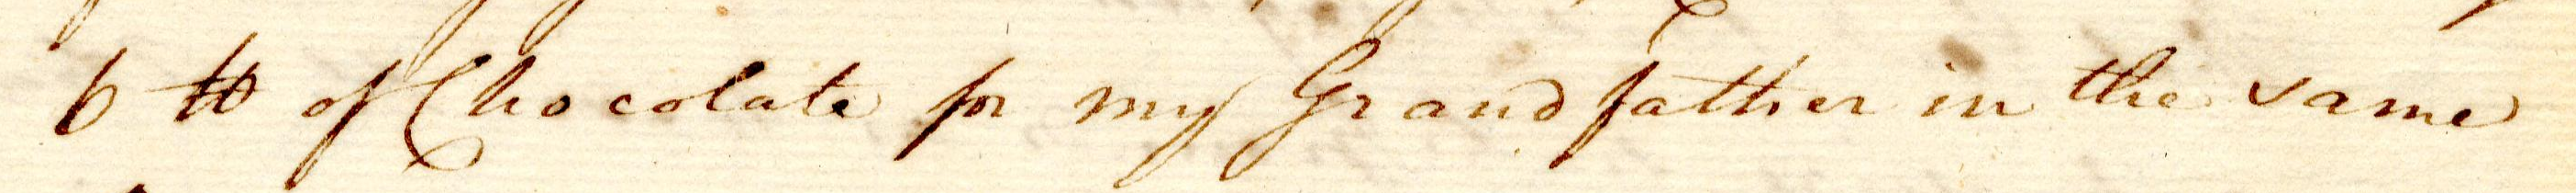6 10 of Chocolate for my Grand father in the same
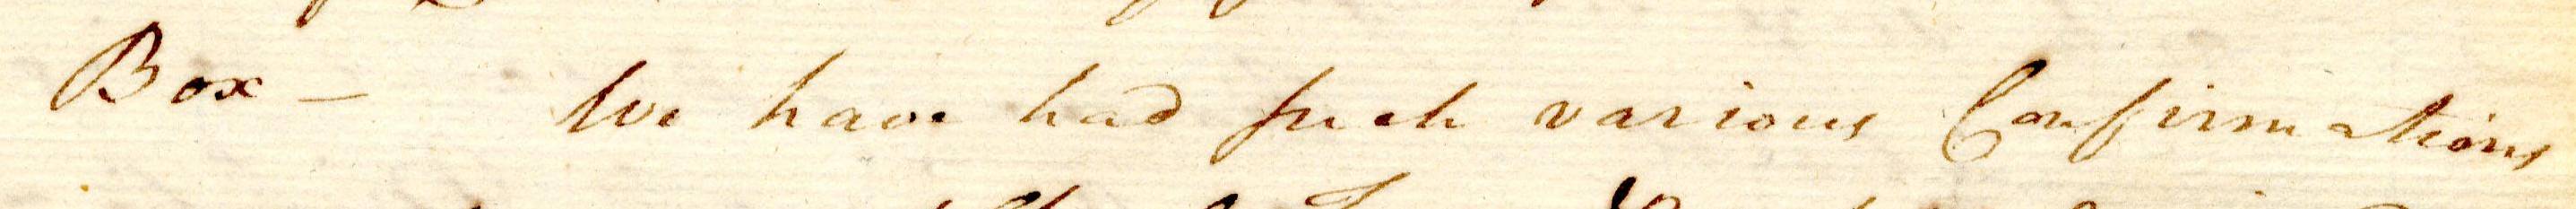Box. We have had such various Confirmations
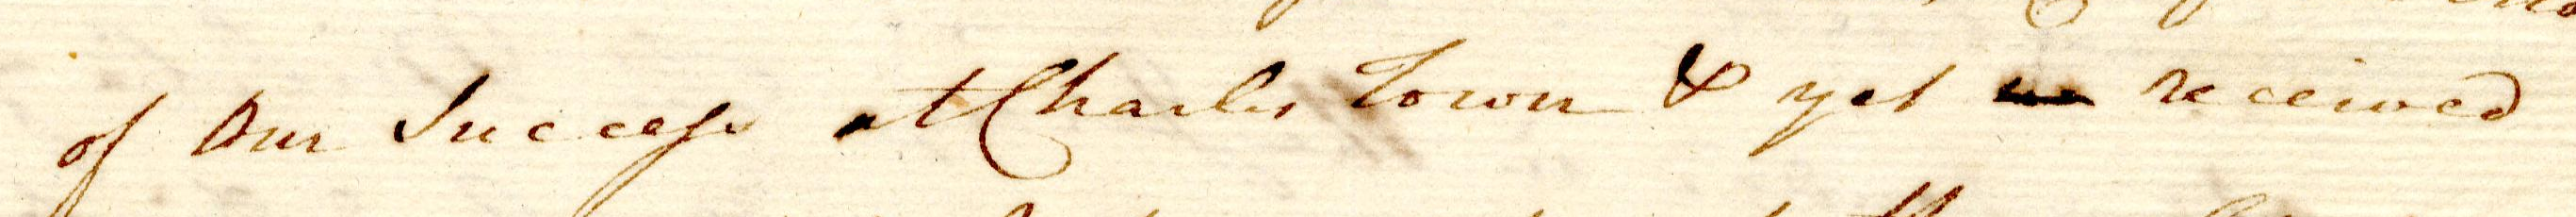of Our Success at Charles Town & yet we received
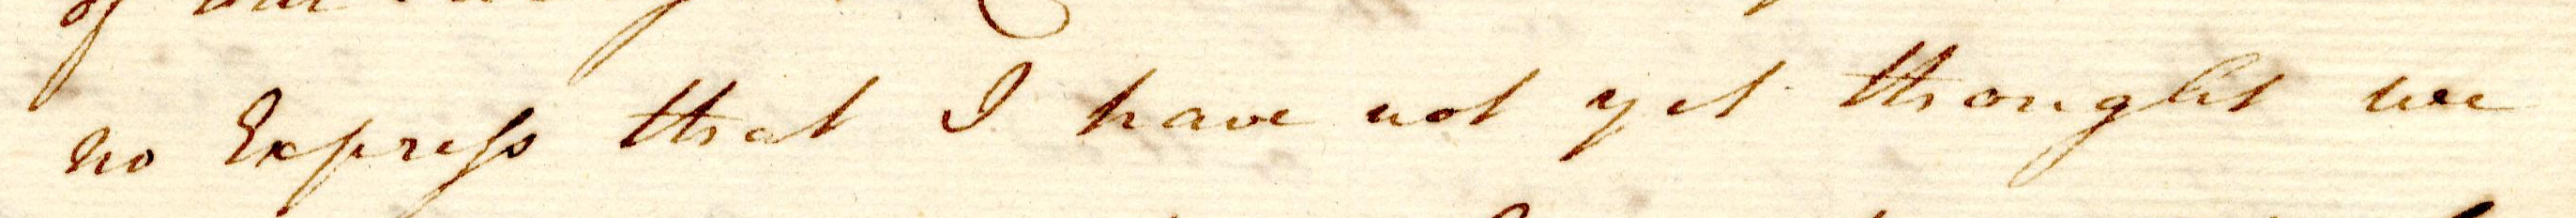no Express that I have not yet thought we
